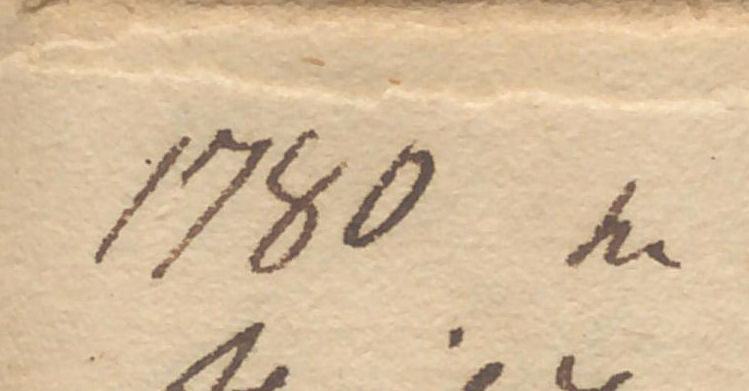1780
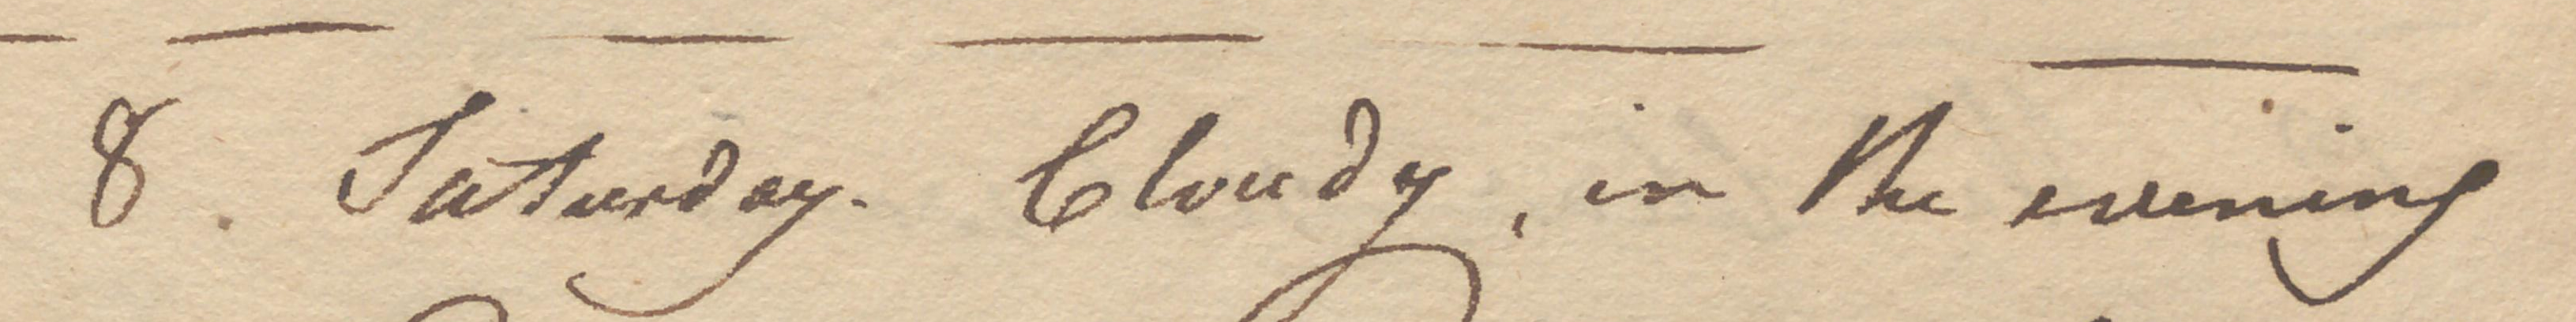8 Saturday. Cloudy, in the evening
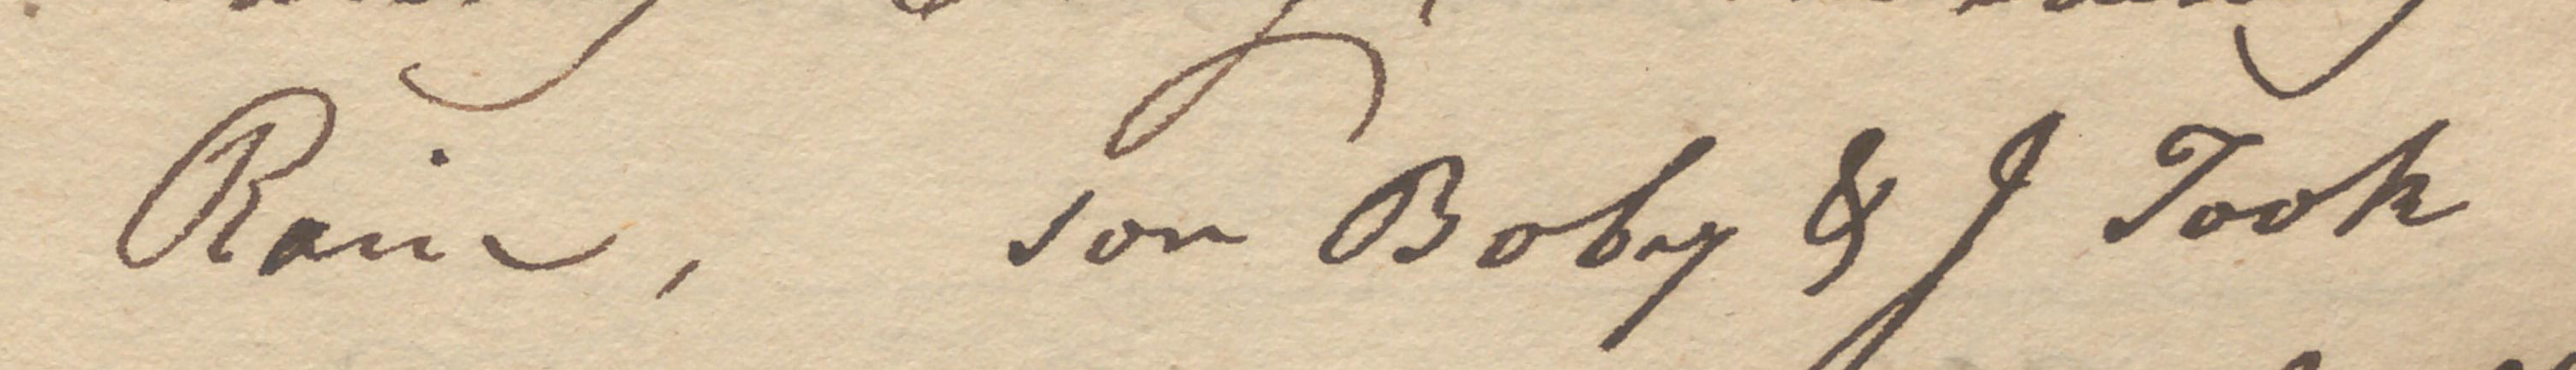Rain, son Bobey & I Took
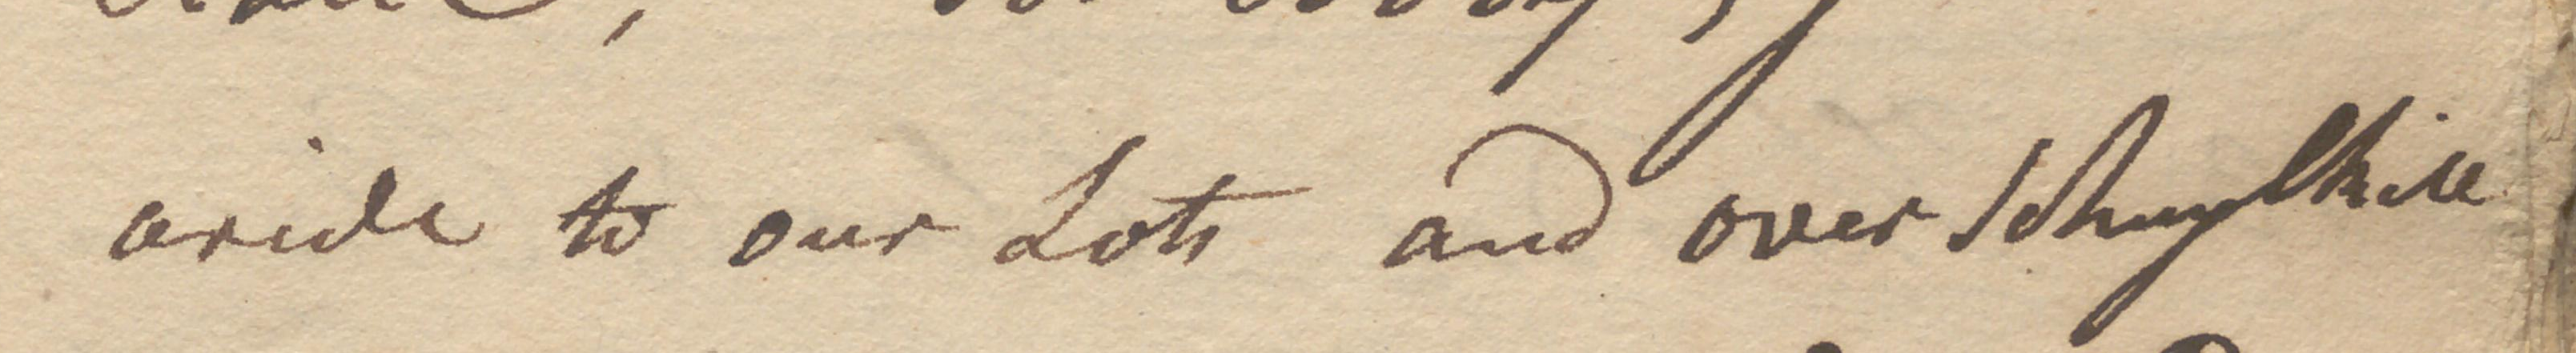a ride to our Lots and over Schuylkill
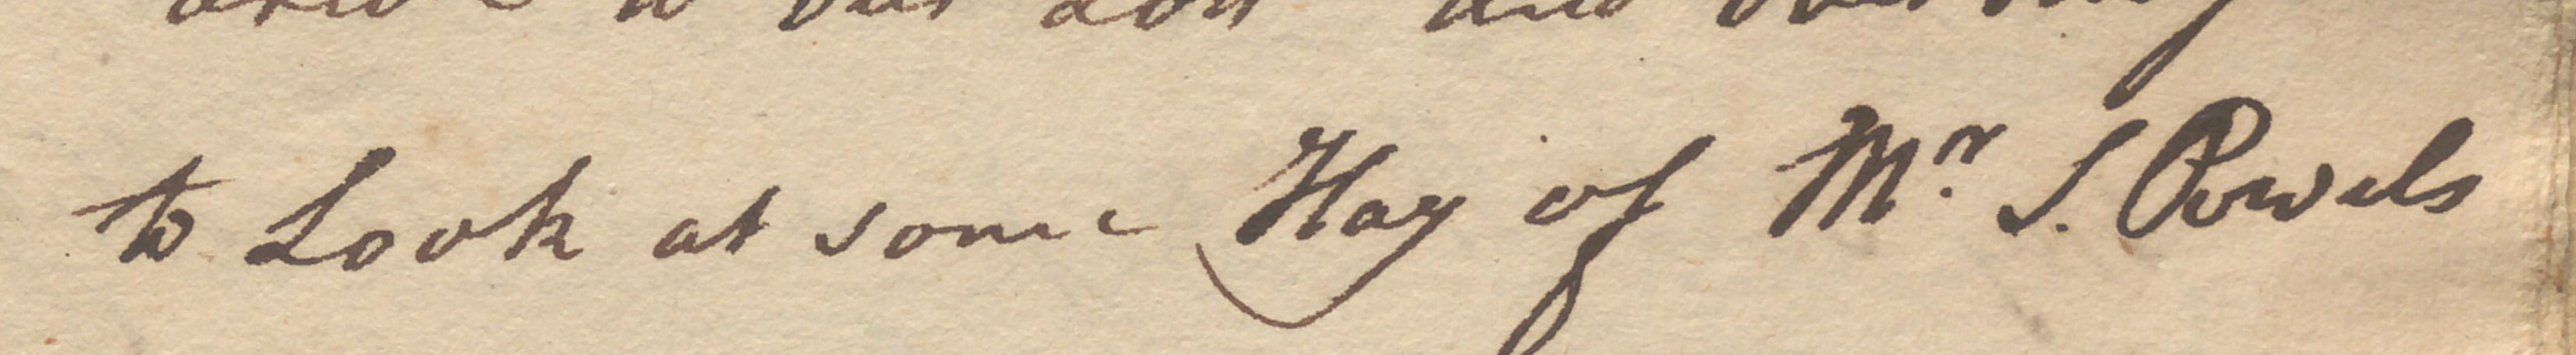to Look at some Hay of M^r. S. Powels
